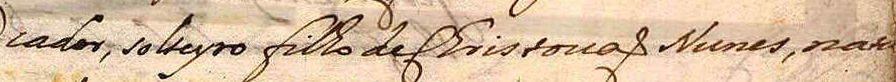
cador, solteyro filho de Christouaõ Nunes, natu
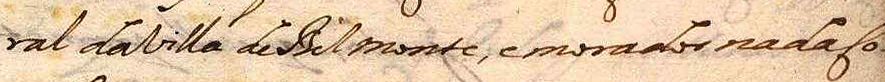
ral da villa de Belmonte, e morador na da Co
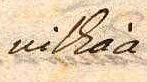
uilhaã
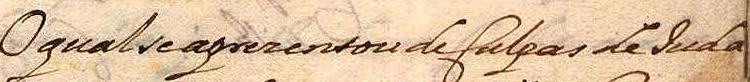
O qual se aprezentou de Culpas de Iuda
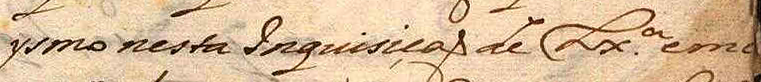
ysmo nesta Inquisiçaõ de Lx.a em o
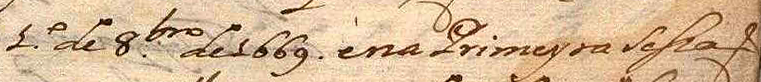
1.o de 8.bro de 1669. e na Primeyra sessaõ
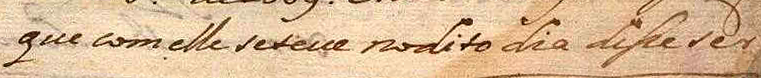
que com elle se teue no dito dia disse ser
